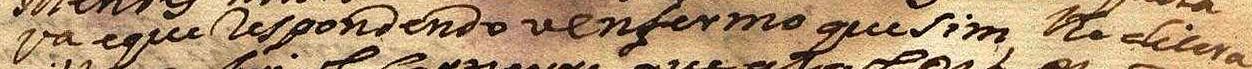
V.a, e que Respondendo o enfermo que sim, lhe dicera
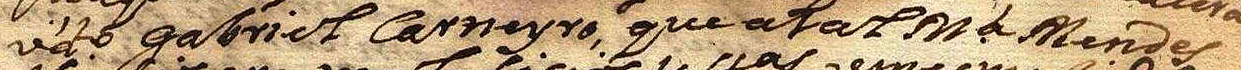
o d̄o gabriel Carneyro, que a tal M.a Mendes
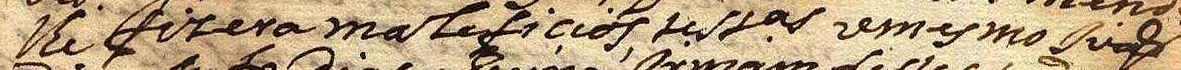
lhe fizera malefiçios, test.as o mesmo Ioaõ
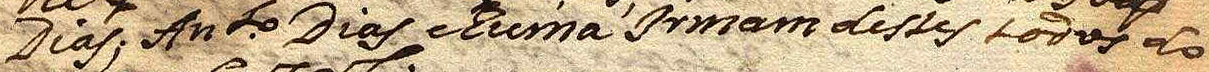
Dias; Ant.o Dias e huma Irmam destes todos do
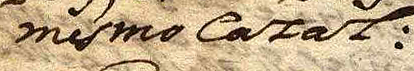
mesmo Cazal:
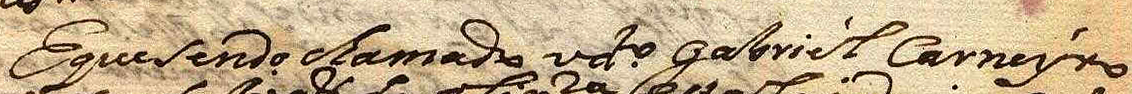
E que sendo chamado o d̄.o gabriel Carneyro
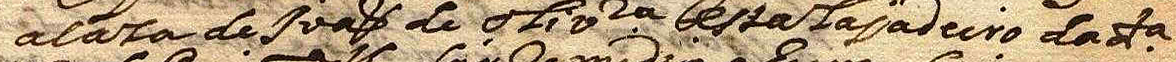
a caza de Ioaõ de oLiv.ra estaLajadeiro da d̄.a
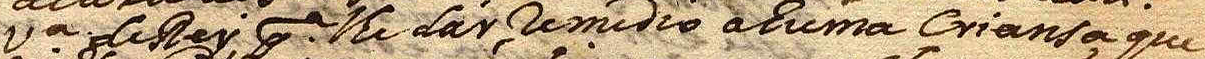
v.a de Rey, p.a lhe dar, Remedio a huma criansa, que
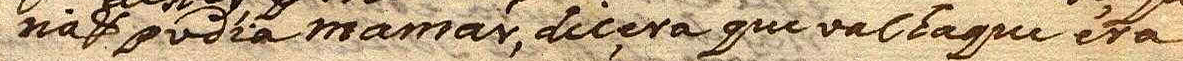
naõ podia mamar, diçera que o achaque era
